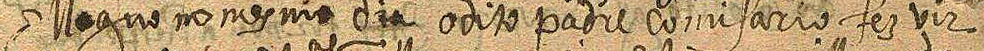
E lloguo no mesmo dia o dito padre comisario fez vir
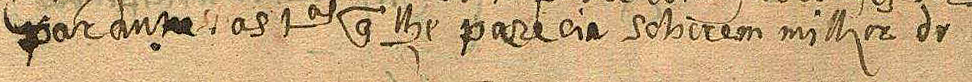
parante si as tas q̄ lhe parecia saberem milhor do
